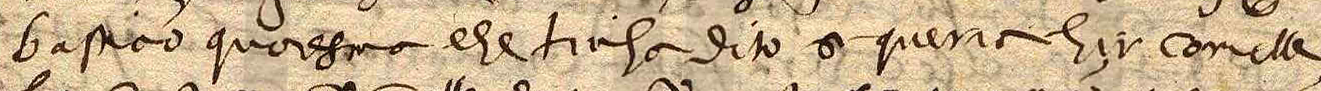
bastiaõ quaresma lhe tinha dito se queria hir com elle
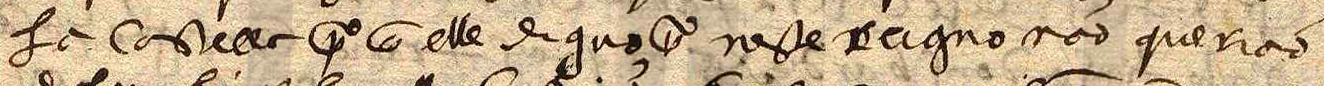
ha castella p̄o q̄ elle diguo p̄o neste reigno naõ queriaõ
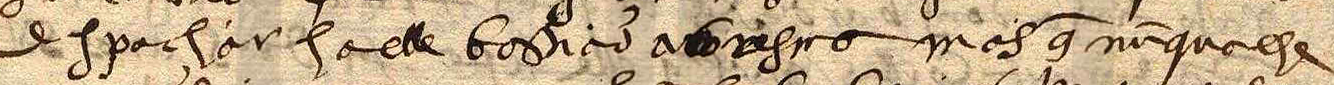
despachar ha elle bastiaõ _resma mas q̄ nūqua lhe
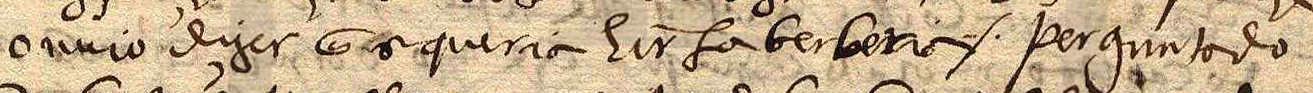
ouuio diser q̄ se queria hir ha berberia /. perguntado
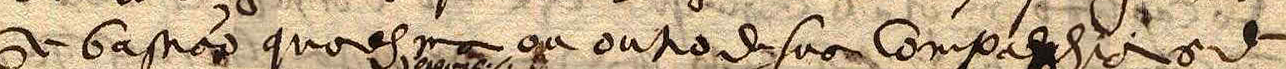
se bastiaõ quaresma ou outro de sua companhia se de
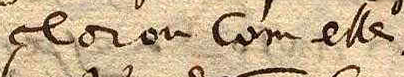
clarou com elle
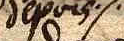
depois ./.
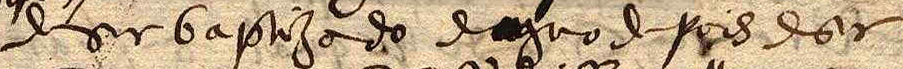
de ser baptizado diguo depois de ser
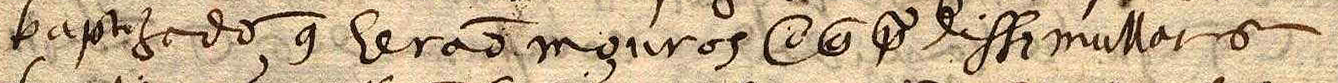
baptizado q̅ heraõ mouros e̅ q̅ p̅o dissimullar se
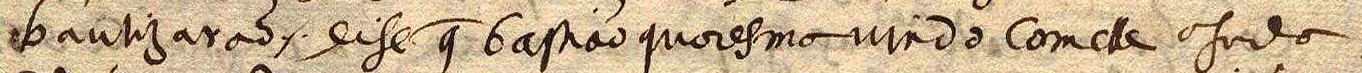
bautizaraõ ./. dise q̄ bastiaõ quaresma uindo com elle aJnda
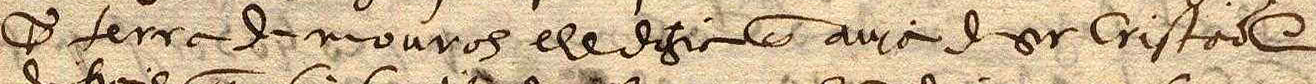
p̄o terra de mouros lhe disia q̄ auia de ser Cristaõ e
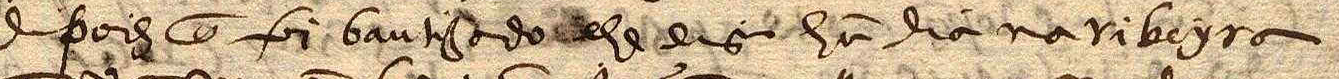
depois q̄ foi bautizado lhe dise hū dia na ribeyra
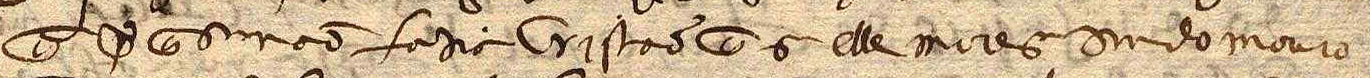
q̄ p̄o q̄ se naõ fasia Cristaõ q̄ se elle morese sendo mouro
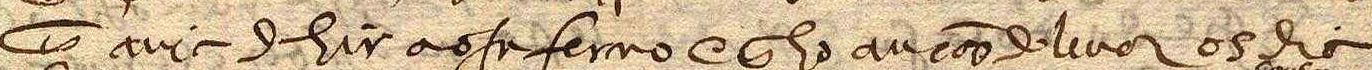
q̄ auia de hir ao Jnferno e q̄ ho auião de leuar os dia
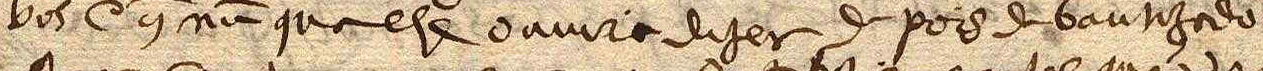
bos e q̄ nūqua lhe ouuira dizer depois de bautizado
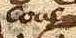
cousa
